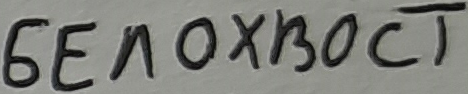белохвост
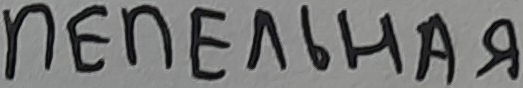пепельная
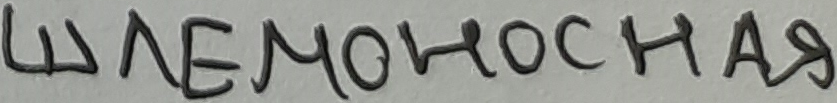шлемоносная
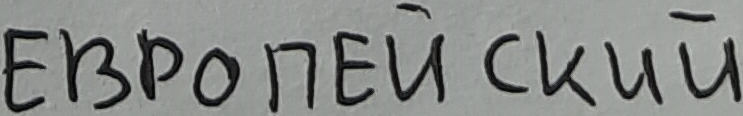европейский
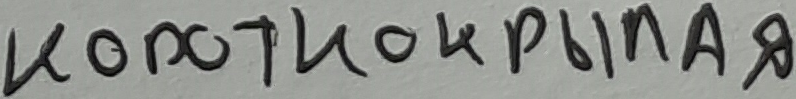короткокрылая
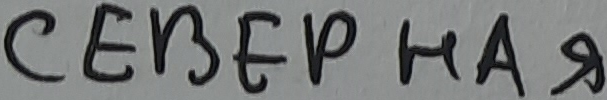северная
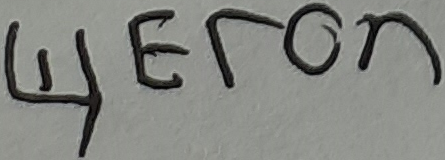щегол
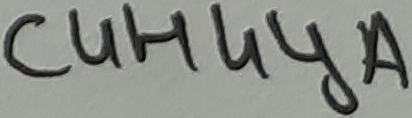синица
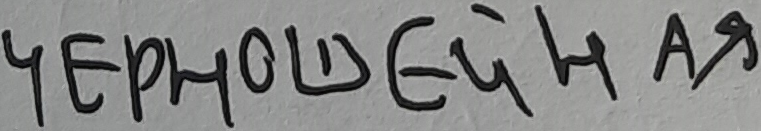черношейная
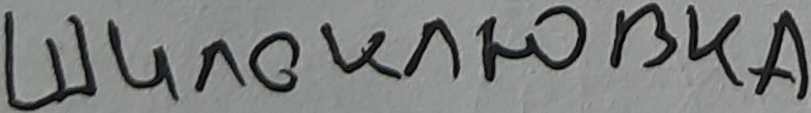шилоклювка
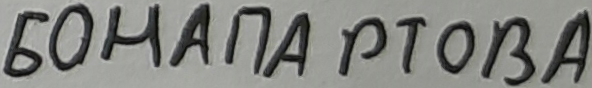бонапартова
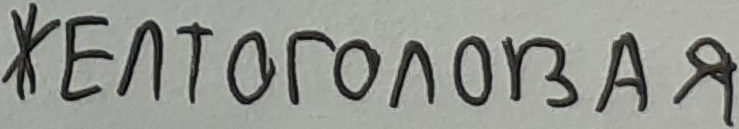желтоголовая
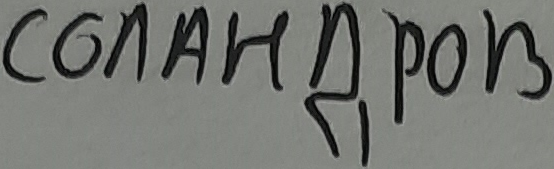соландров
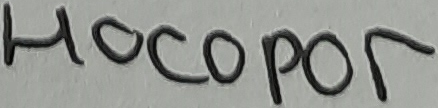носорог
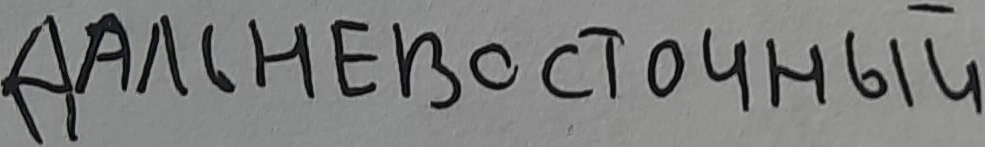дальневосточный
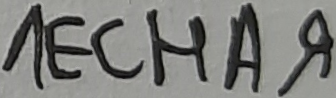лесная
